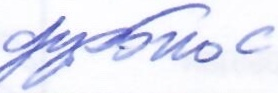дубонос
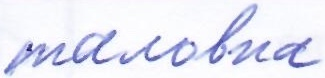таловка
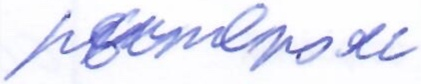рыжепояс
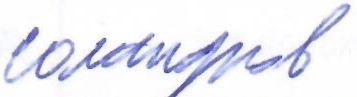соландпов
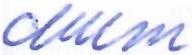аист
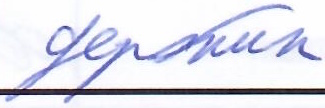дербник
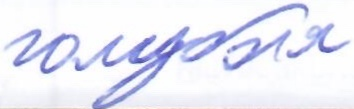голубая
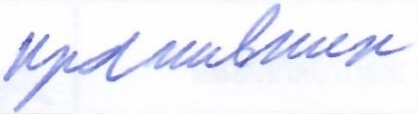крапивник
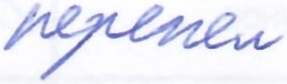перепел
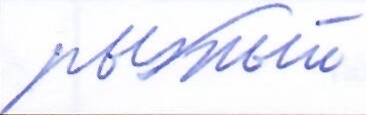рыбный
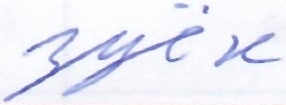зуёк
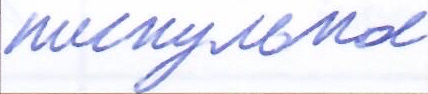пискулька
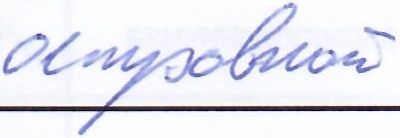островной
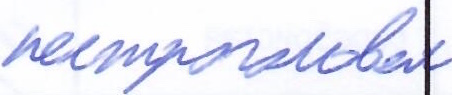пестроголовая
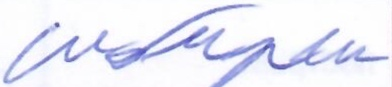сибирск
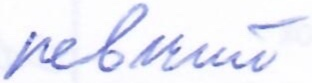певчий
